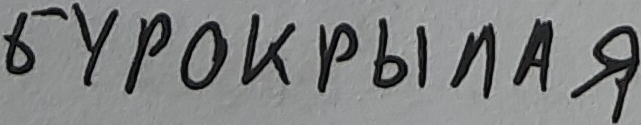бурокрылая
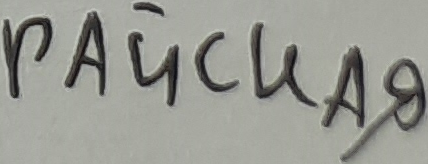райская
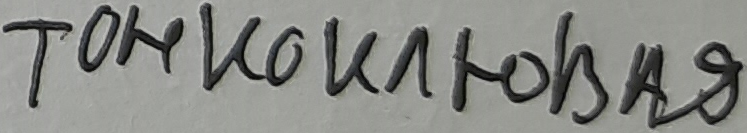тонкоклювая
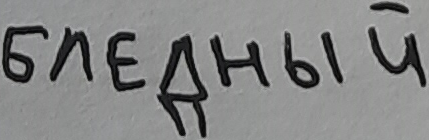бледный
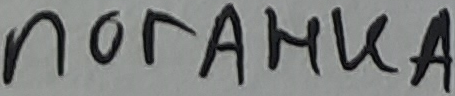поганка
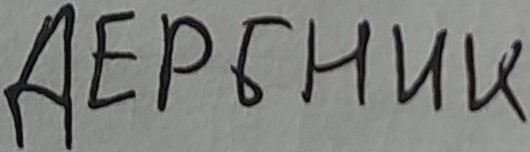дербник
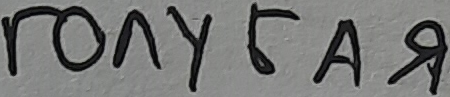голубая
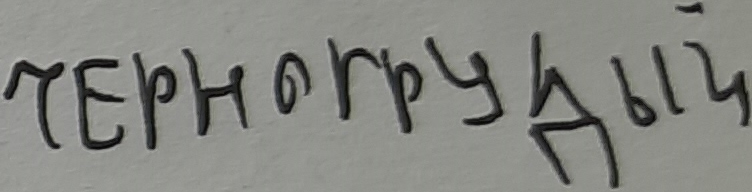черногрудый
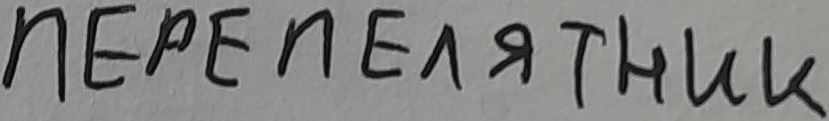перепелятник
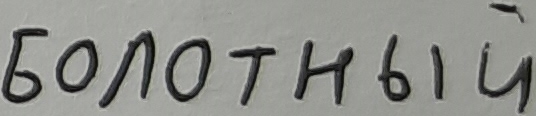болотный
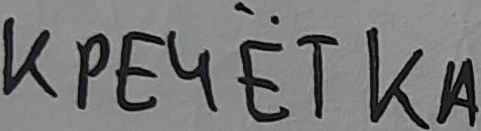кречётка
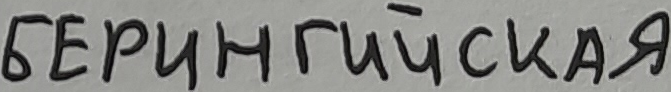берингийская
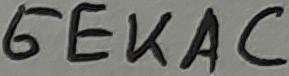бекас
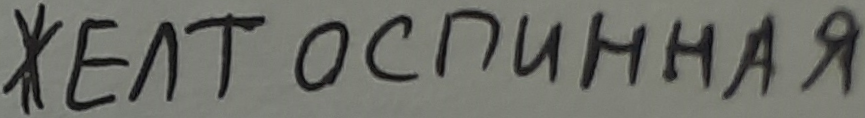желтоспинная
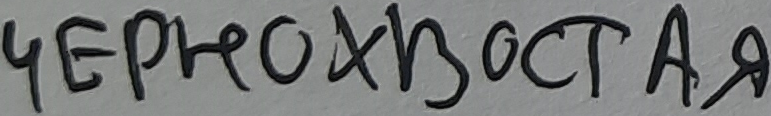чернохвостая
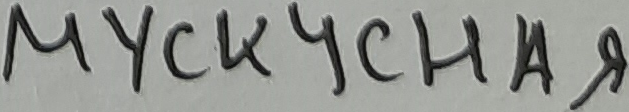мускусная
